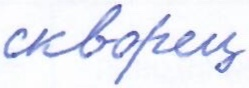скворец
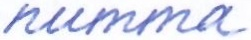питта
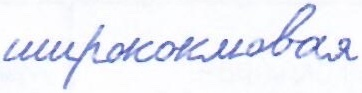ширококлювая
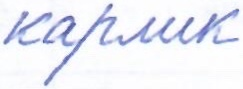карлик
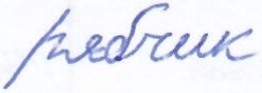рябчик
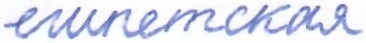египетская
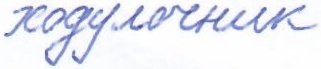ходулочник
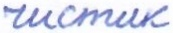чистик
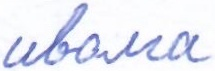иволга
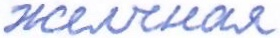желчная
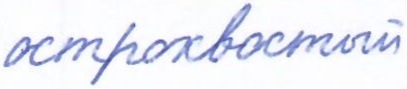острохвостый
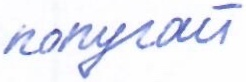попугай
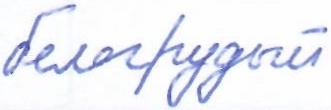белогрудый
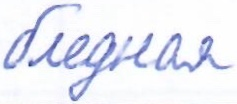бледная
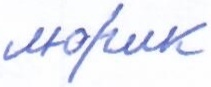люрик
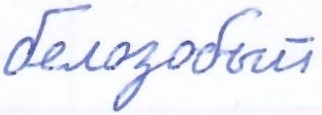белозобый
